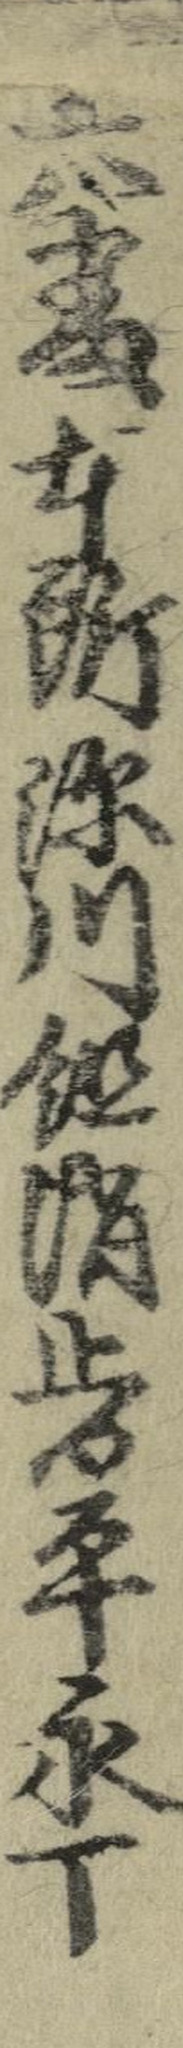六番本所深川組消止る平永丁
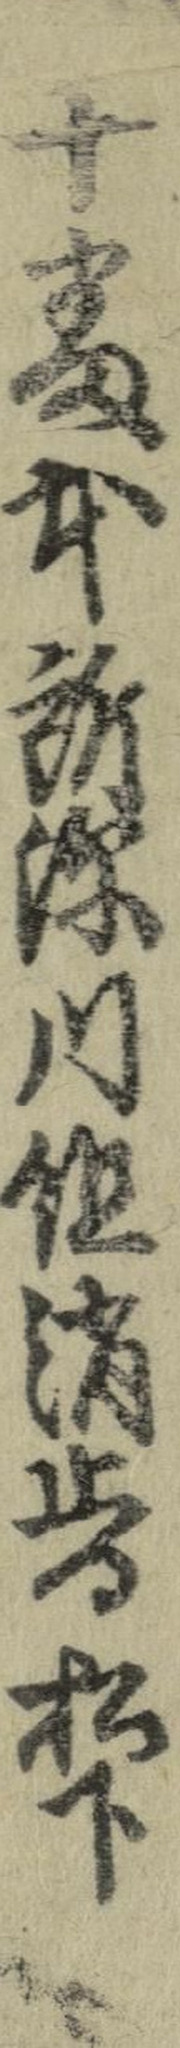十番本所深川組消止る松下
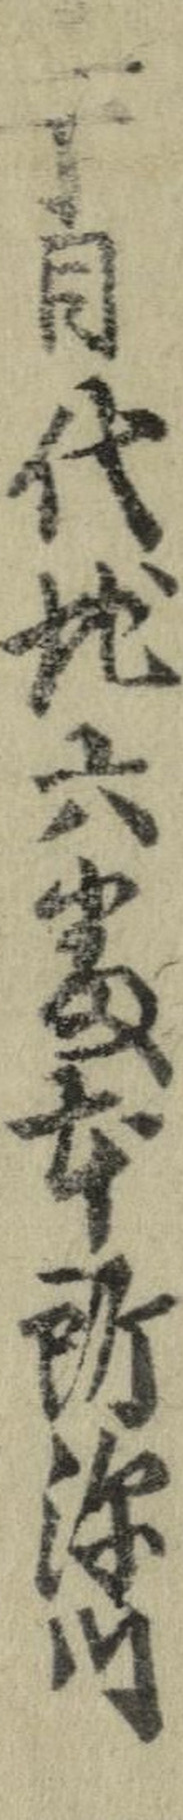丁一丁目代地六番本所深川
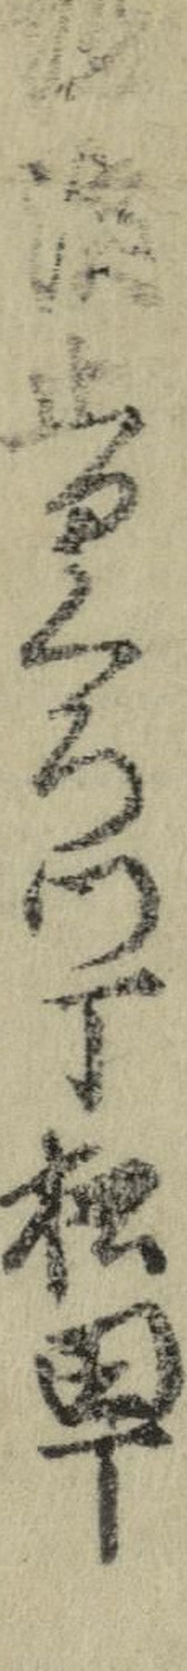組消止るくろ門丁松田丁
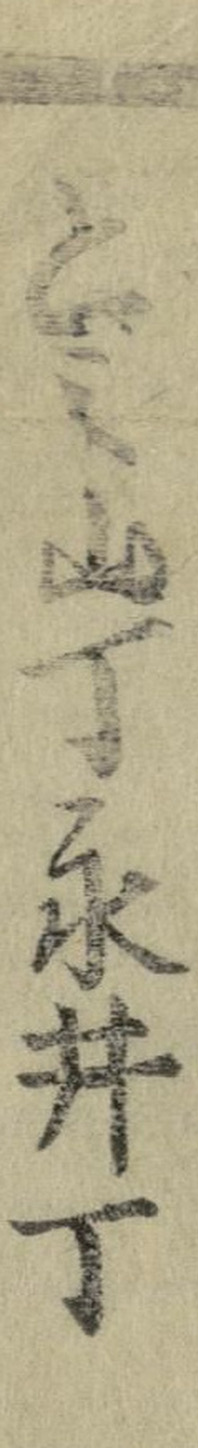とみ山丁永井丁
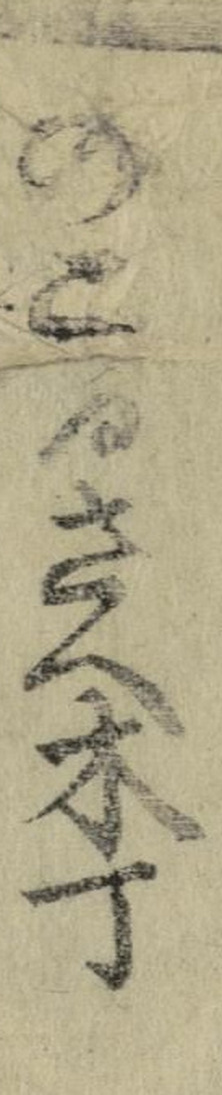のこるさへ木丁
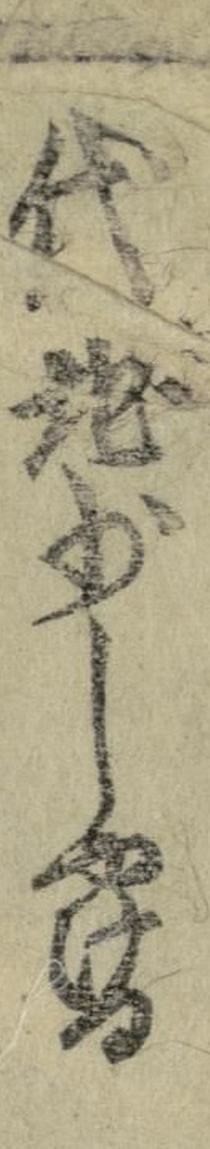代地少しやける
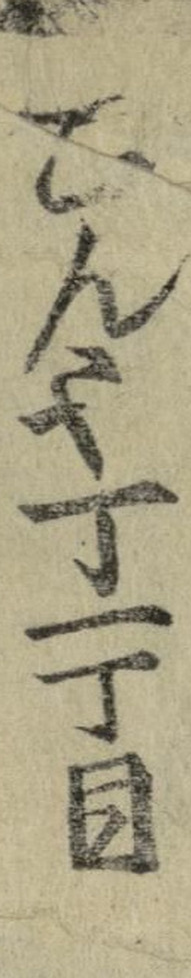こんや丁一丁目
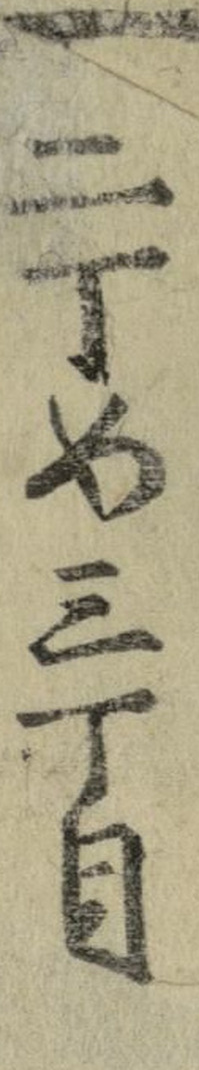二丁め三丁目
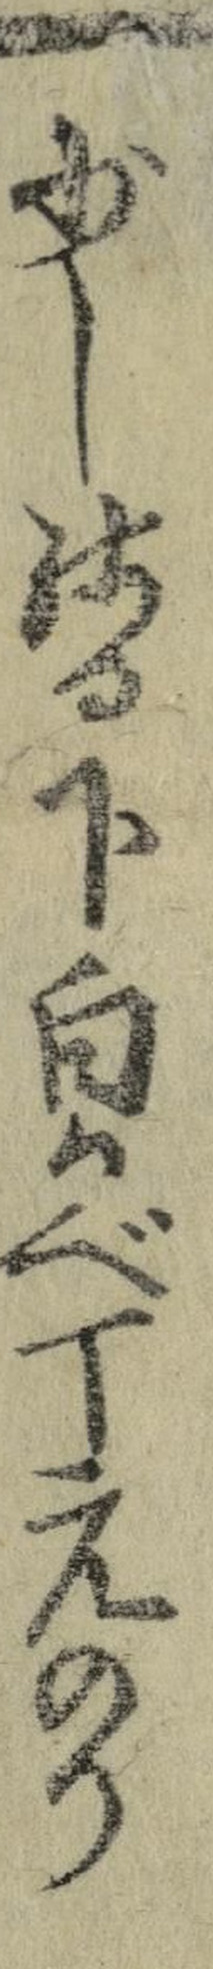少し残る下白かべ丁元のり
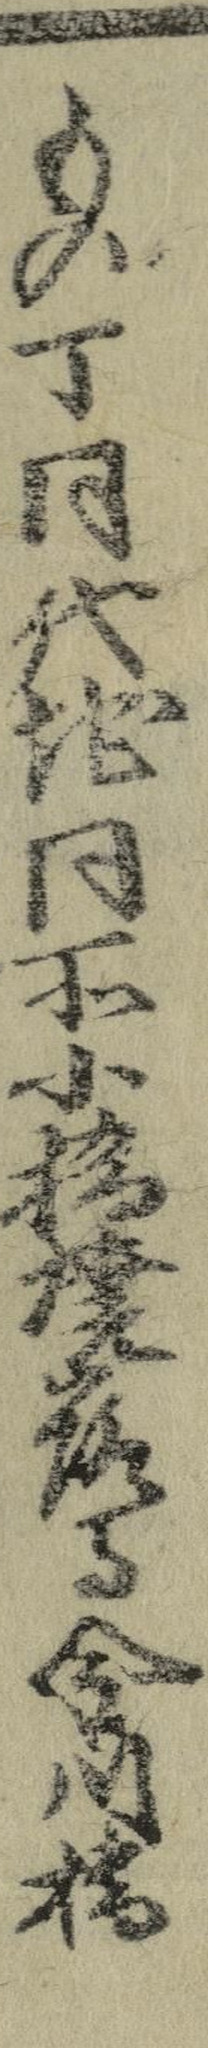もの丁同代地同所小橋焼落る今川橋
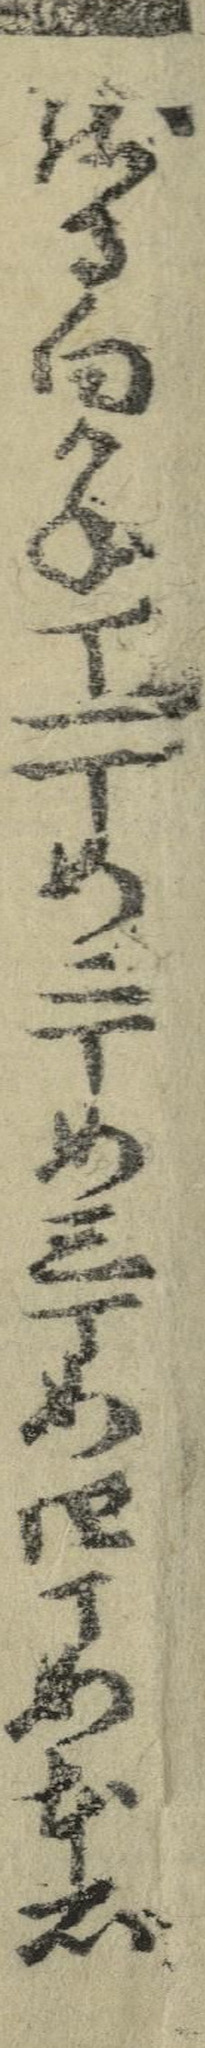残る白かね丁一丁め二丁め三丁め四丁め本石
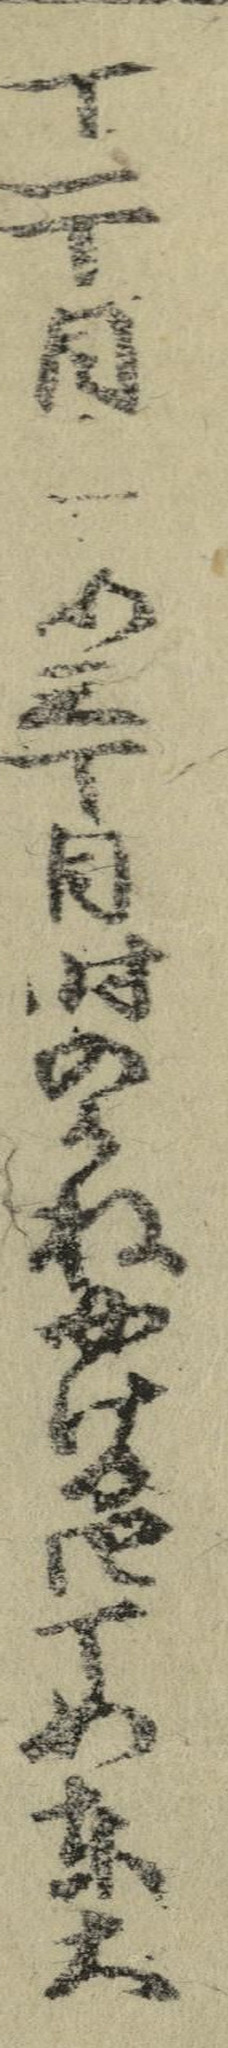丁一丁め二丁め三丁め時のかねやける四丁め東大
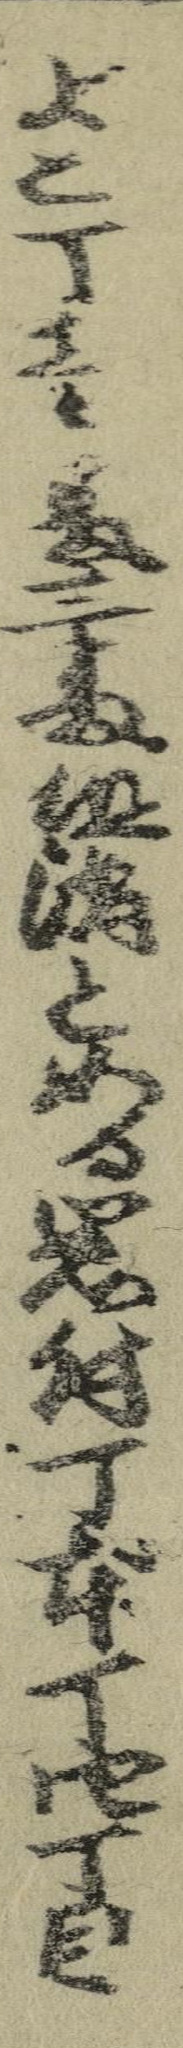よこ丁壱番三番組消とめる岩付丁本庁四丁目
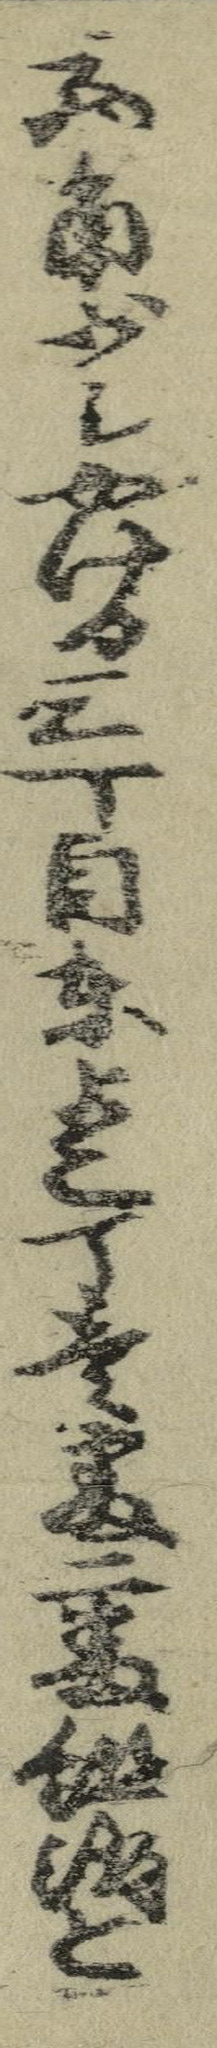西角少しやける三丁目東よこ丁壱番二番組消と
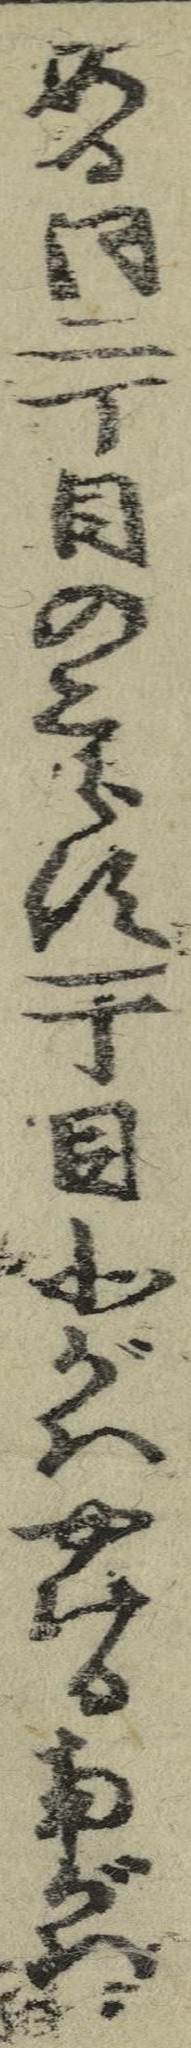める同二丁目のこらず一丁目北かはやける南がは
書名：[安政元年十二月の江戸大火に関する瓦版]
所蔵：東京大学地震研究所図書室 Earthquake Research Institute Library, The University of Tokyo, JAPAN
